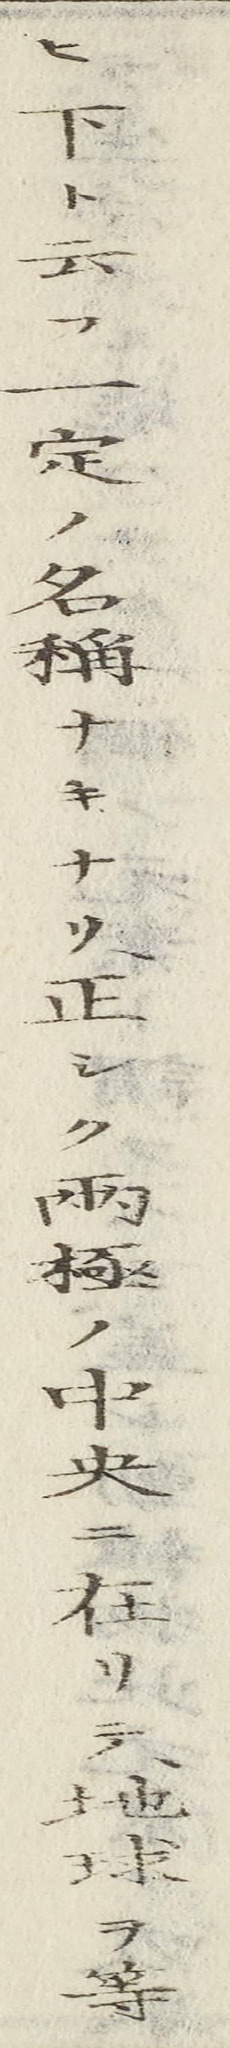ヒ下ト云フ一定ノ名称ナキナリ、正シク両極ノ中央ニ在リテ、地球ヲ等
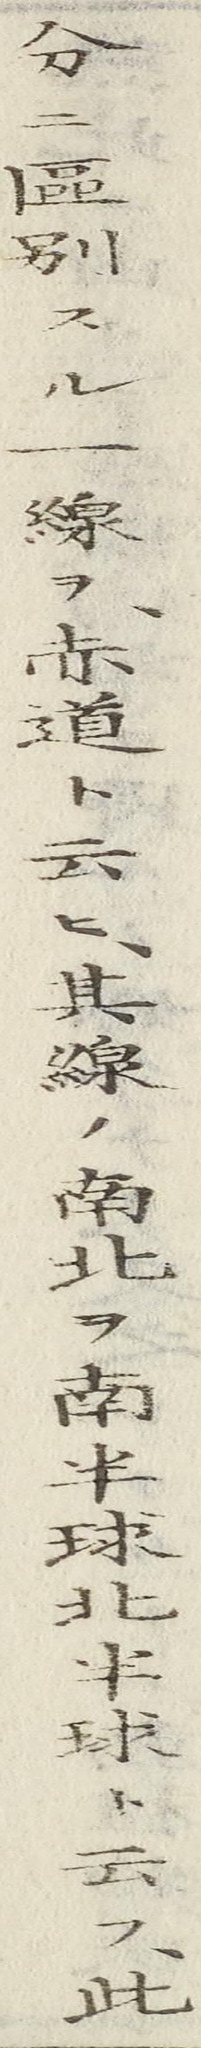分ニ区別スル一線ヲ、赤道ト云ヒ、其線ノ南北ヲ南半球北半球ト云フ、此
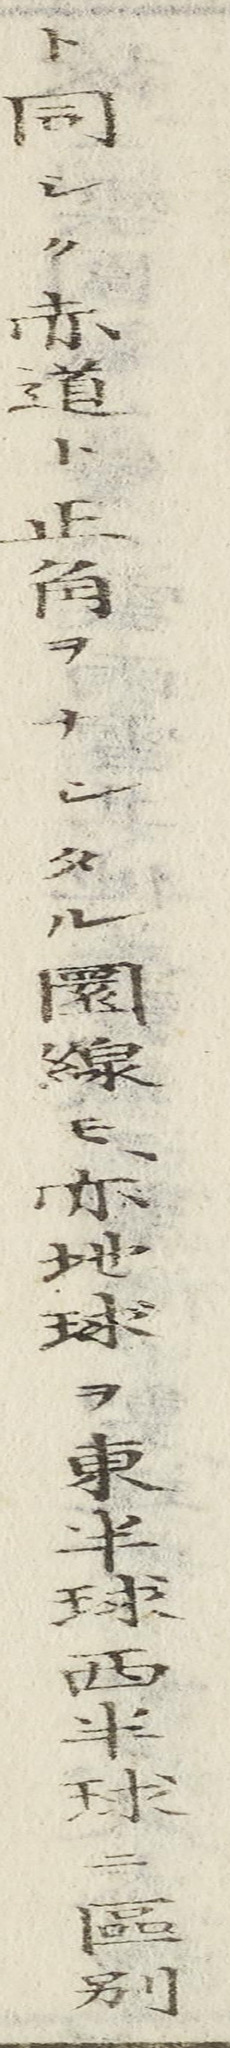ト同シク赤道ト正角ヲナシタル園線モ、亦地球ヲ東半球西半球ニ区別
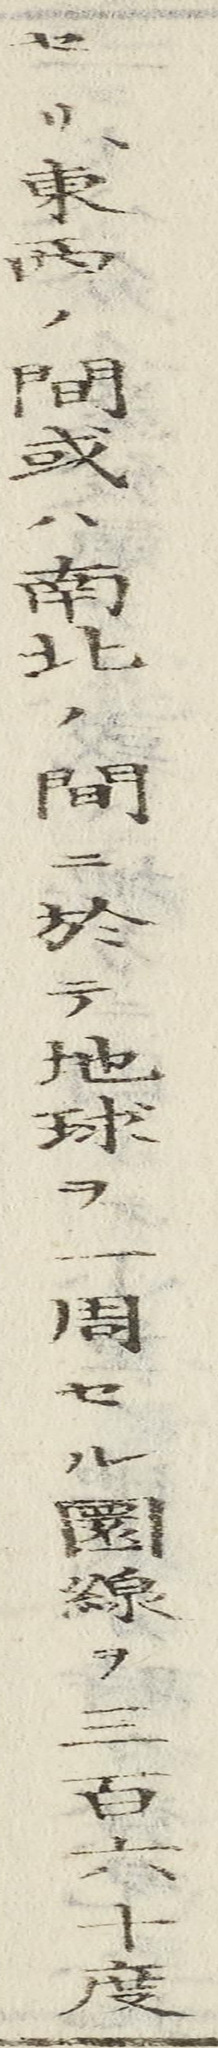セリ、東西ノ間或ハ南北ノ間ニ於テ地球ヲ一周セル園線ヲ三百六十度
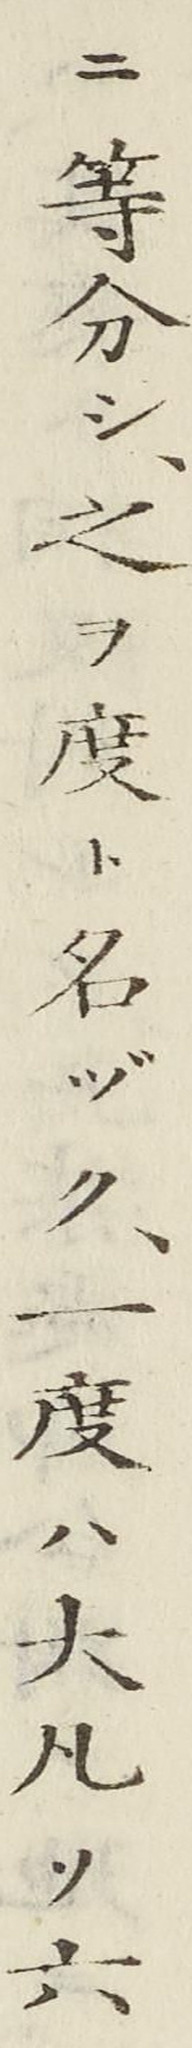ニ等分シ、之ヲ度ト名ヅク、一度ハ大凡六
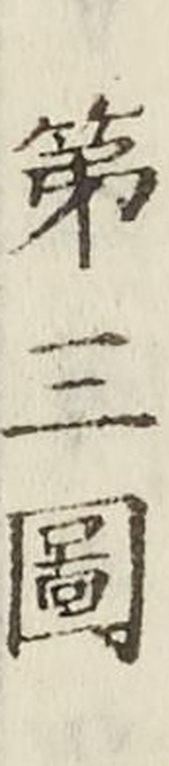第三図
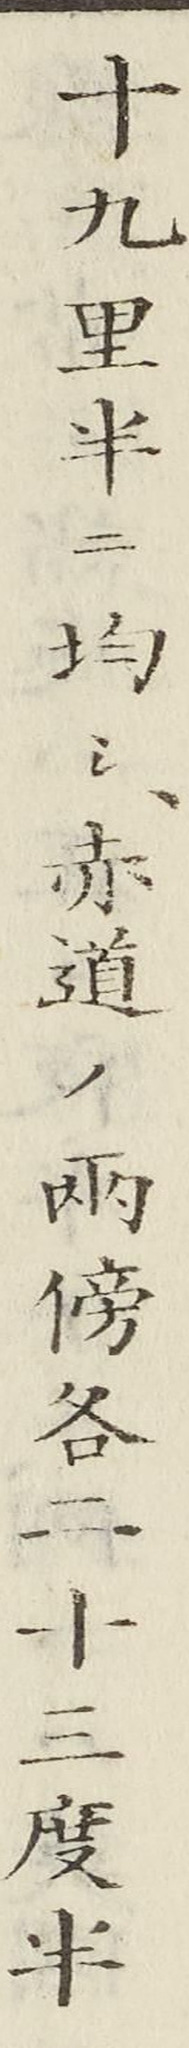十九里半ニ均シ、赤道ノ両傍各二十三度半
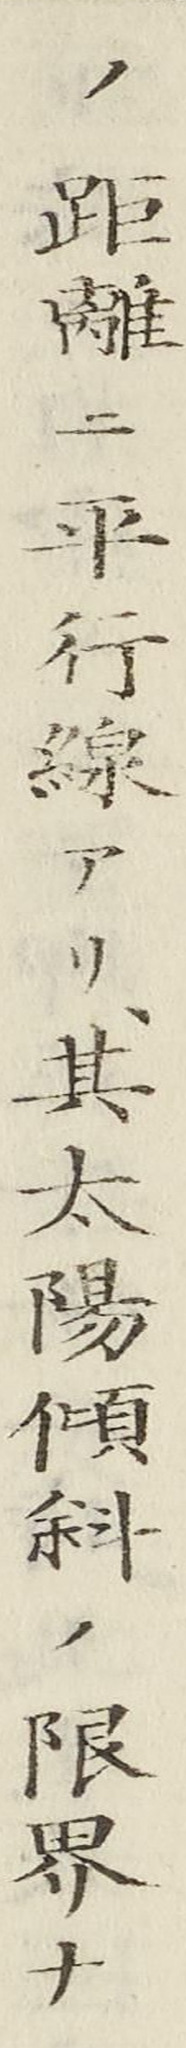ノ距離ニ平行線アリ、其太陽傾斜ノ限界ナ
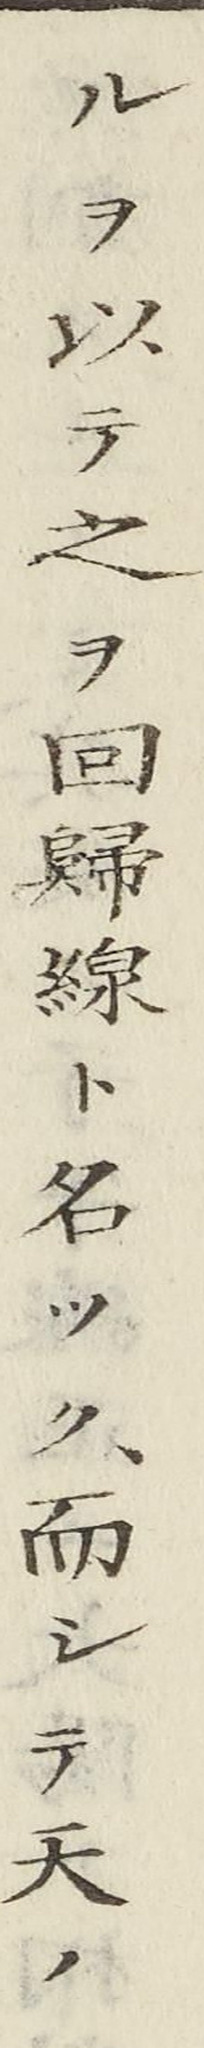ルヲ以テ之ヲ回帰線ト名ツク、而シテ天ノ
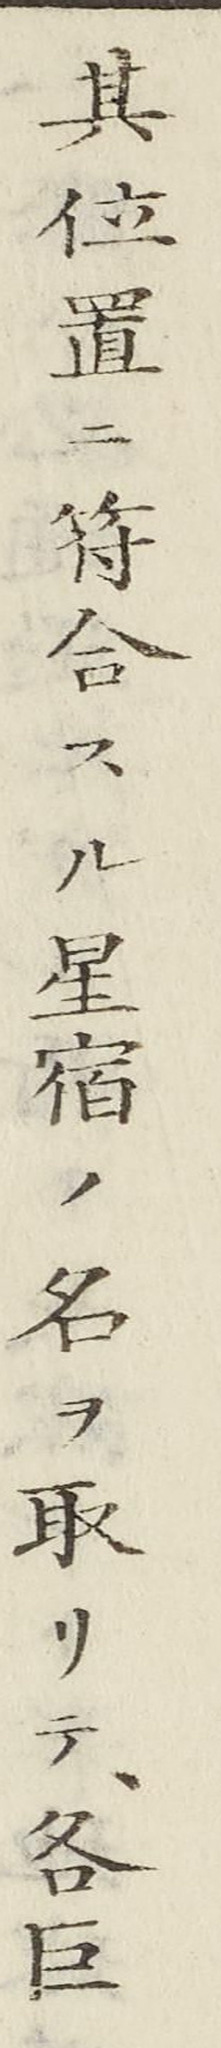其位置ニ符合スル星宿ノ名ヲ取リテ、各巨
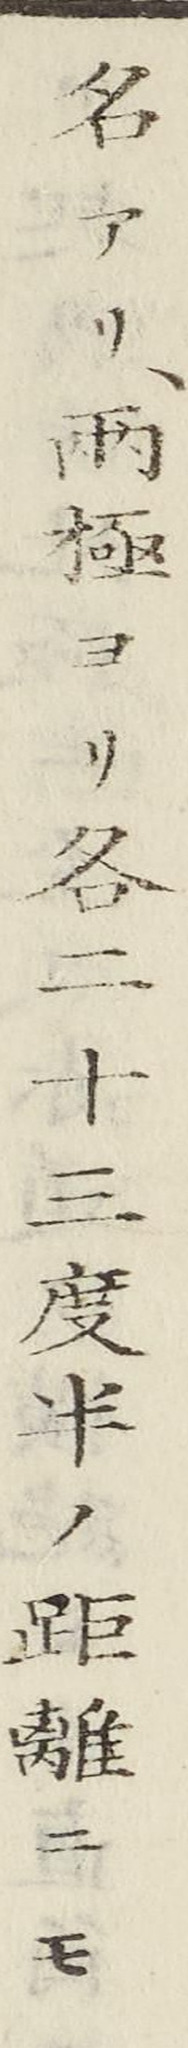名アリ、両極ヨリ各二十三度半ノ距離ニモ
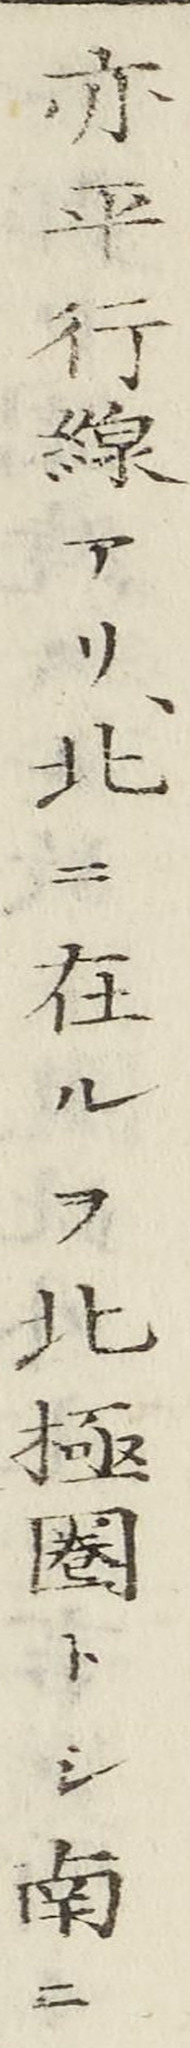亦平行線アリ、北ニ在ルヲ北極圏トシ南ニ
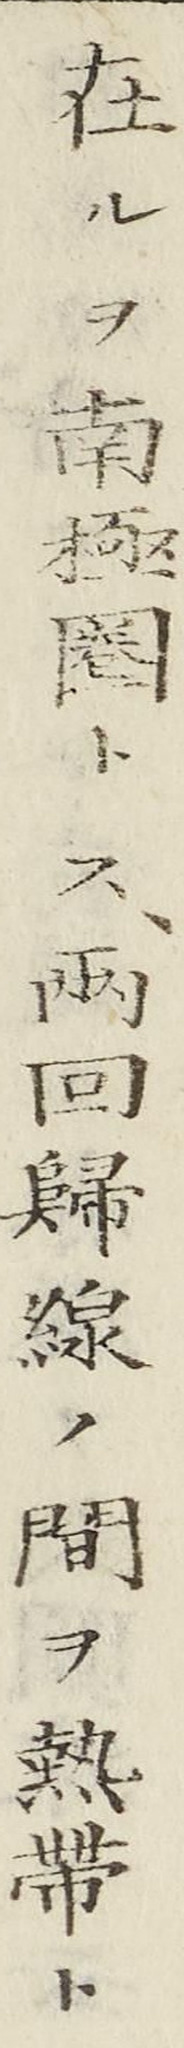在ルヲ南極圏トス、両回帰線ノ間ヲ熱帯ト
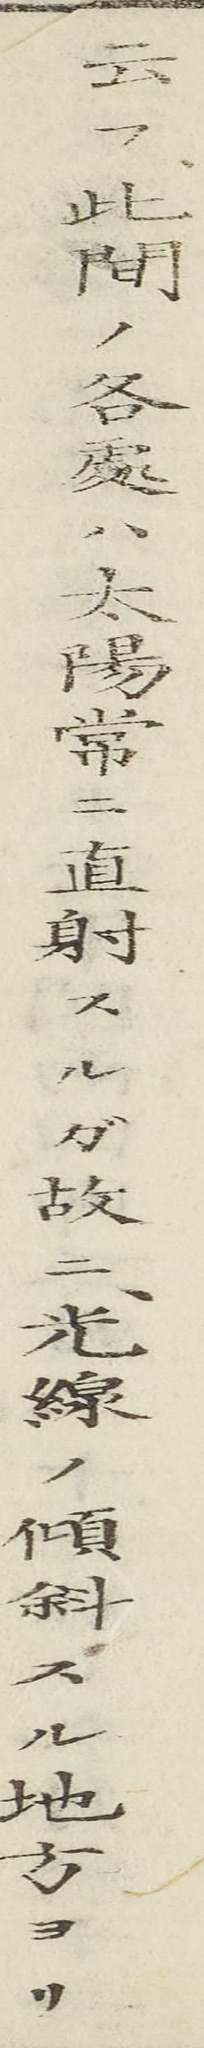云フ、此間ノ各処ハ太陽常ニ直射スルガ故ニ、光線ノ傾斜スル地方ヨリ
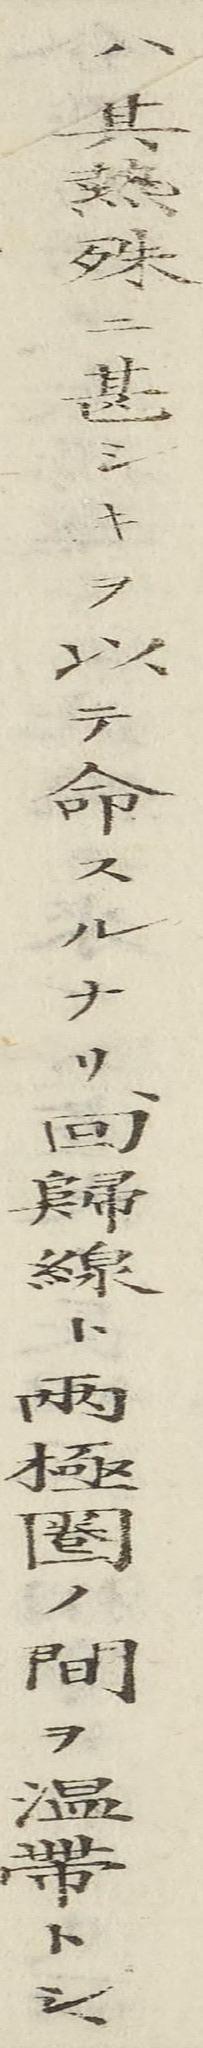ハ其熱殊ニ甚シキヲ以テ命スルナリ、回帰線ト両極圏ノ間ヲ温帯トシ、
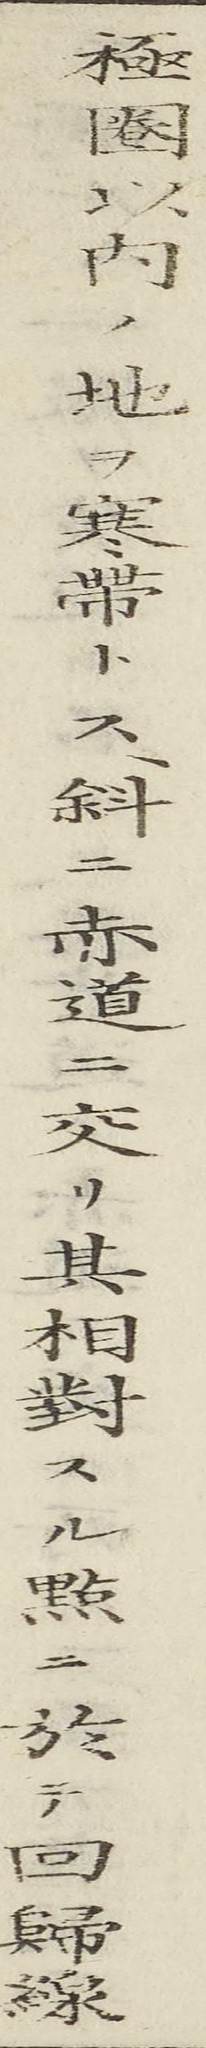極圏以内ノ地ヲ寒帯トス、斜ニ赤道ニ交リ其相対スル点ニ於テ回帰線
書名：百科全書　地文學　全
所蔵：東京大学地震研究所図書室 Earthquake Research Institute Library, The University of Tokyo, JAPAN
